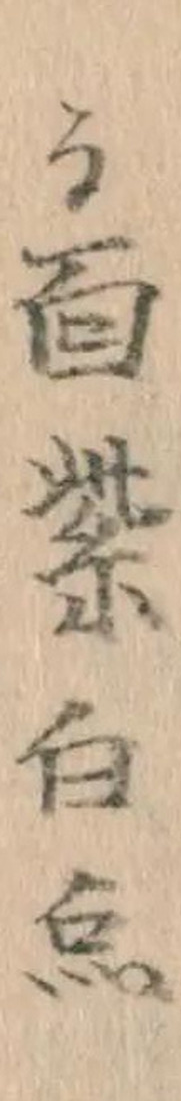る面紫白点
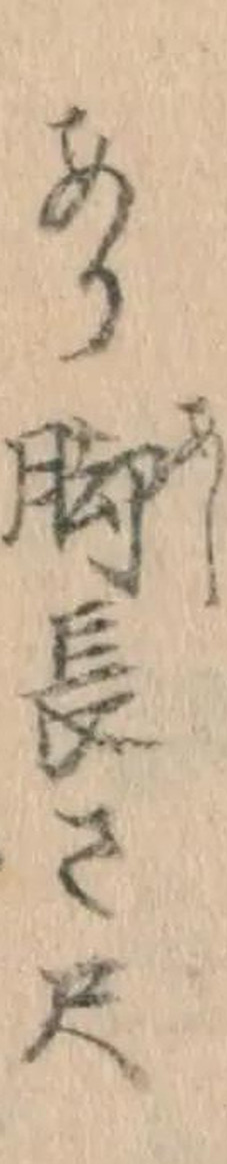あり脚長さ尺
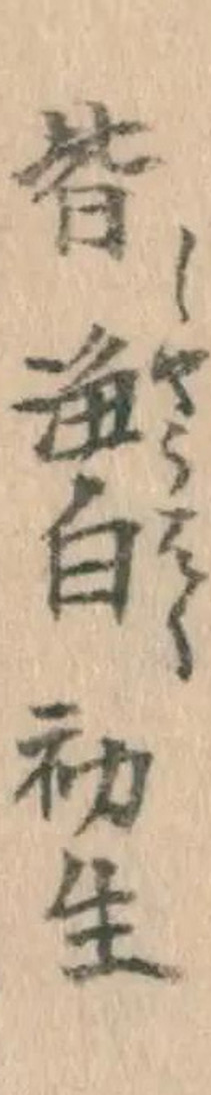皆浄白初生
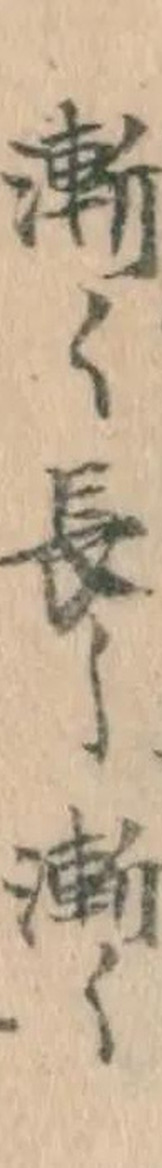漸く長し漸く
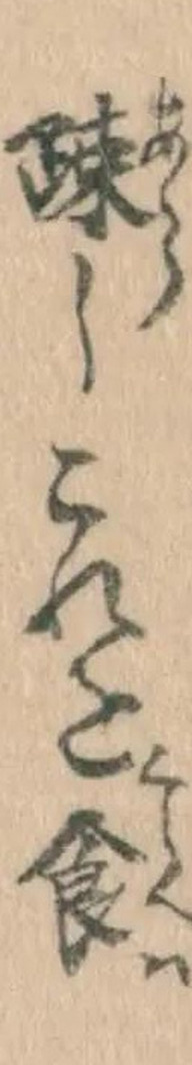疎しこれを食
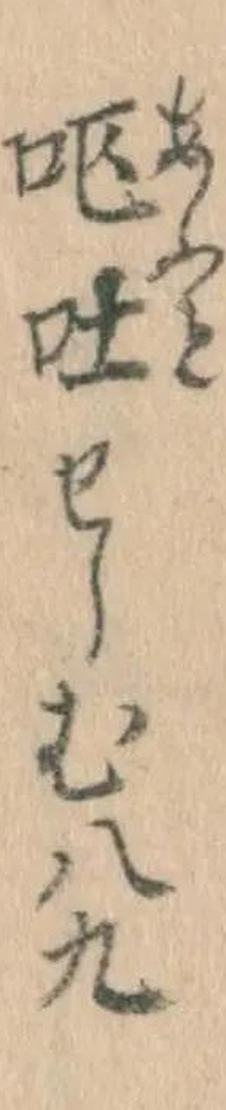嘔吐せしむ八九
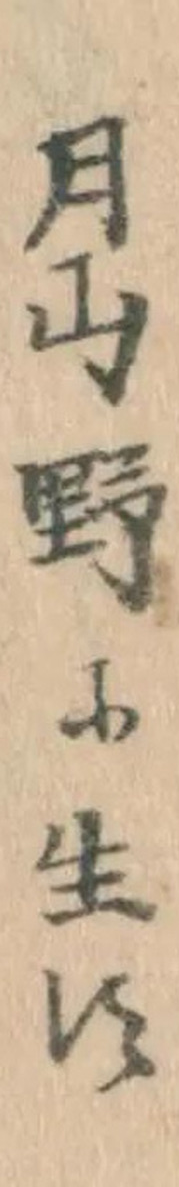月山野に生す
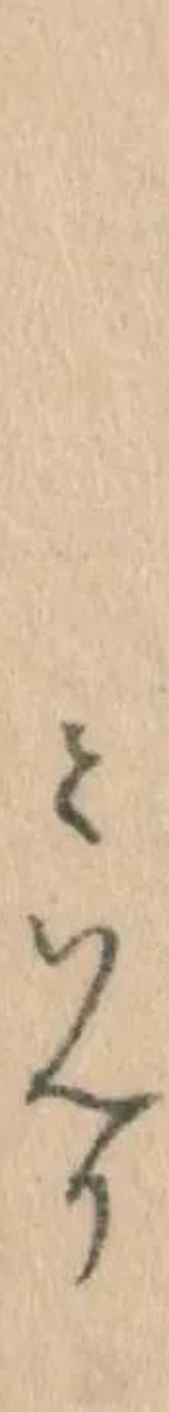といへり
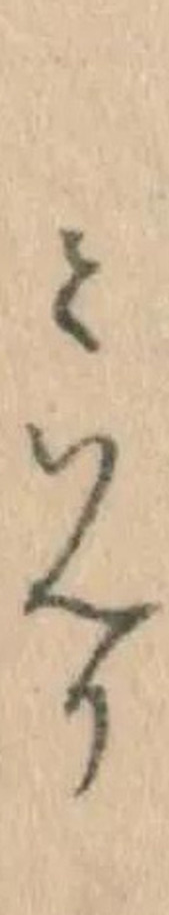といへり

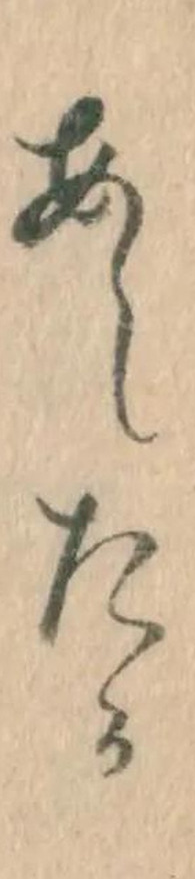あしたか
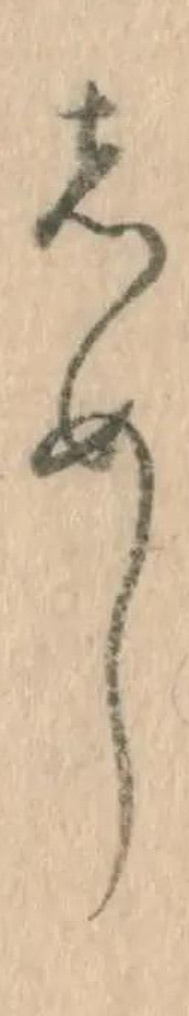しめし
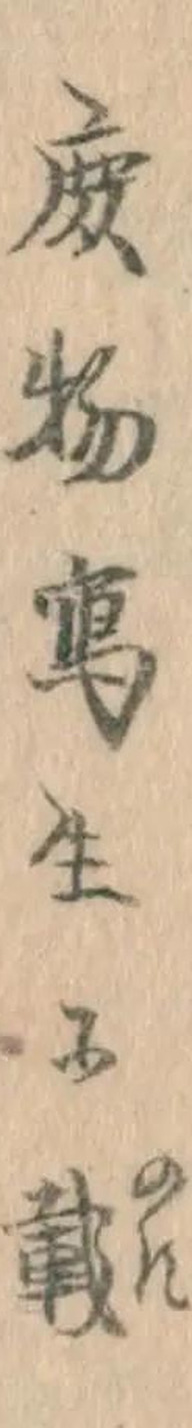庶物写生に載
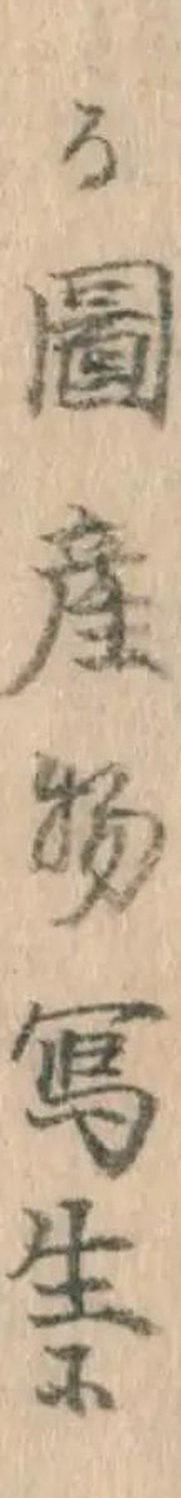る図産物写生に
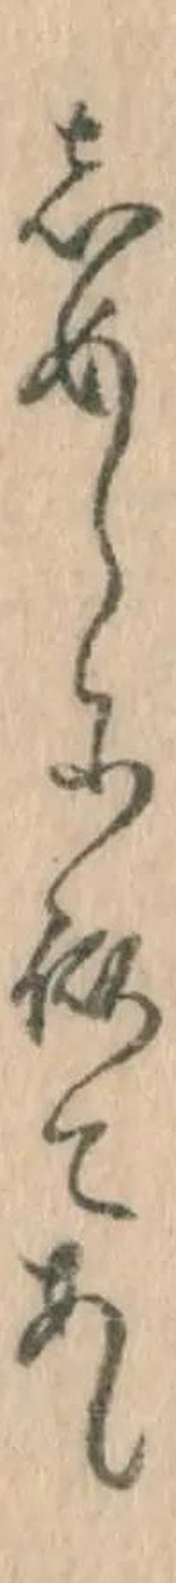しめしに似てあし
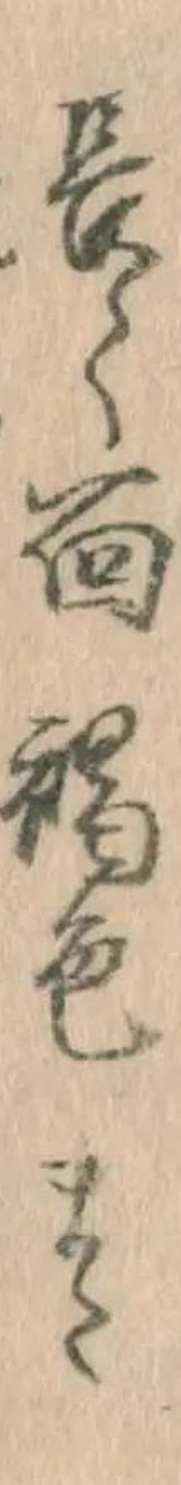長く面褐色また
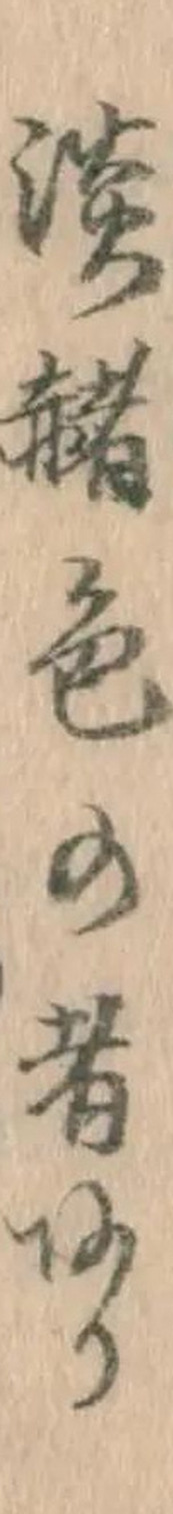淡赭色の者あり
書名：本草図譜. 巻58-60
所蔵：国立国会図書館 National Diet Library, JAPAN
